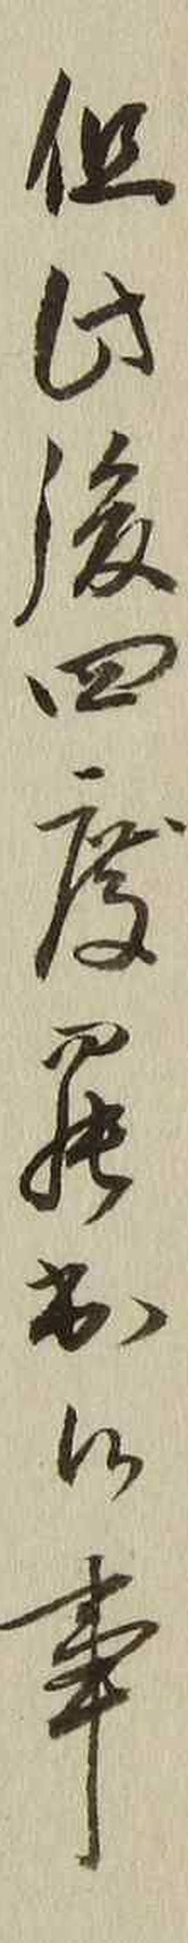但此後四度罷出候事
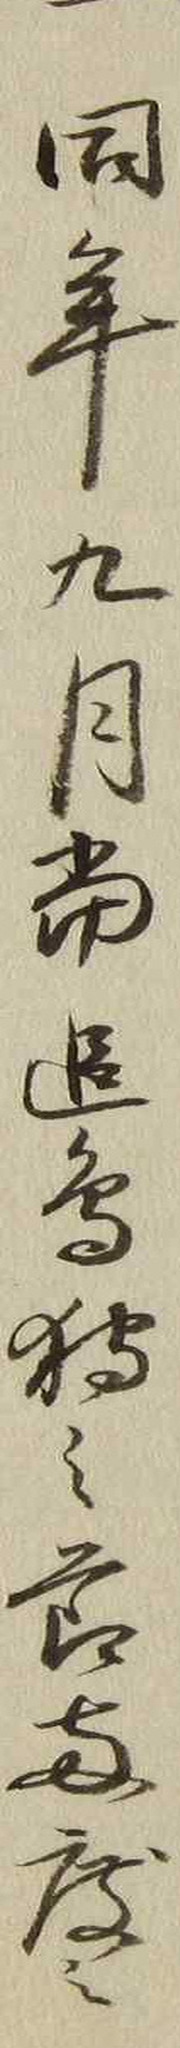一同年九月当追鳥狩之節両度之
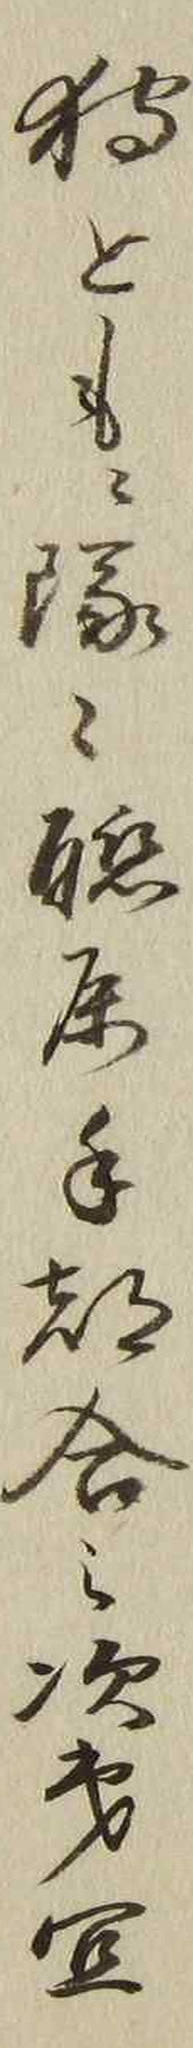狩ともに隊々聯属手都合之次第宜
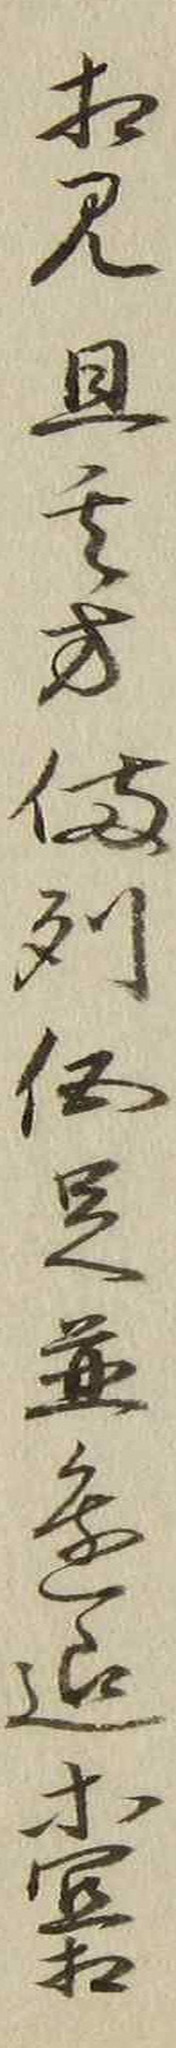相見且其方備列伍足並進退等宜相
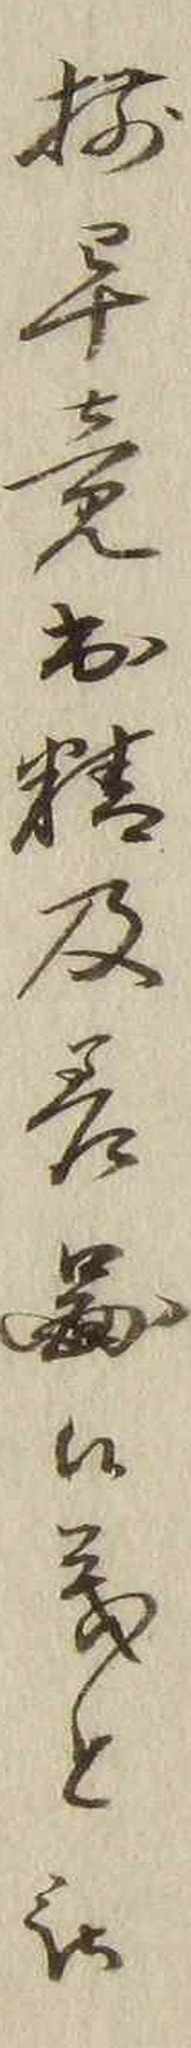揃畢竟出精及差図候義と被
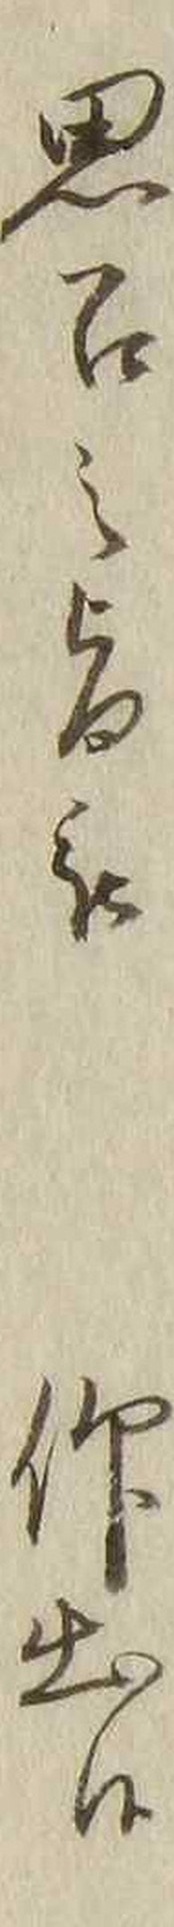思召之旨被仰出候
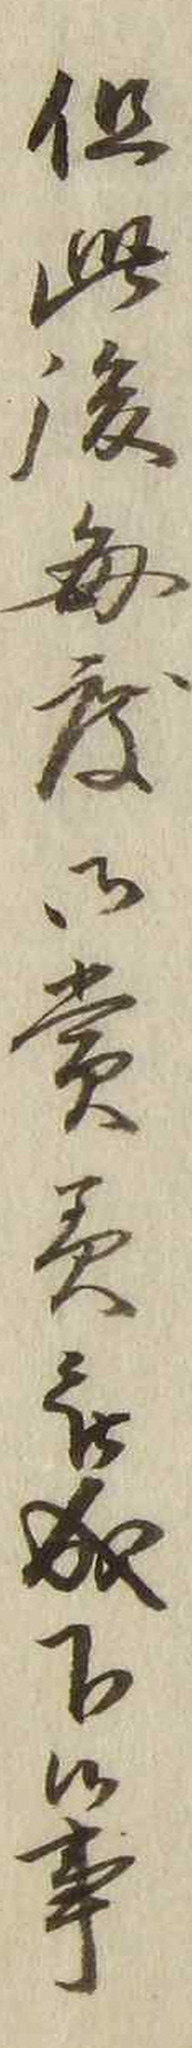但此後毎度御賞美被成下候事

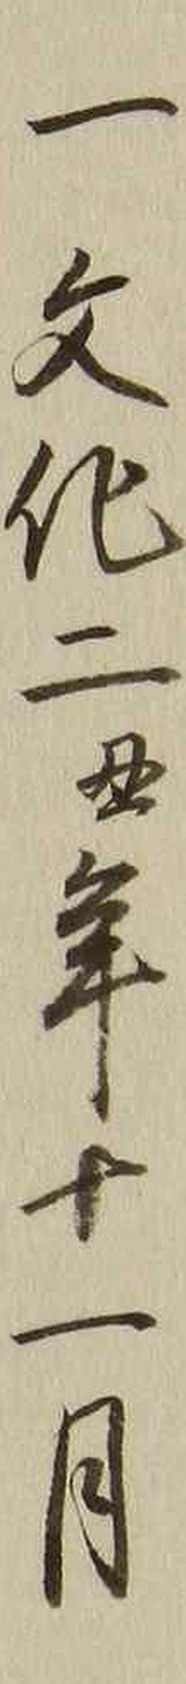一文化二丑年十一月
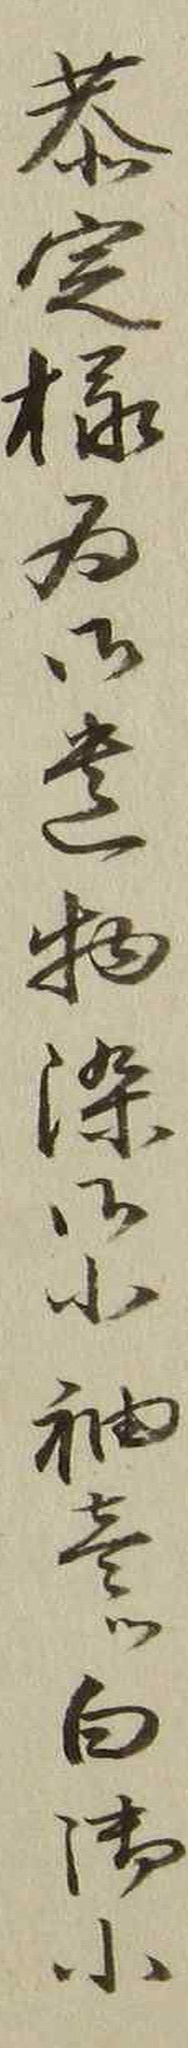恭定様為御遺物染御小袖壱つ白御小
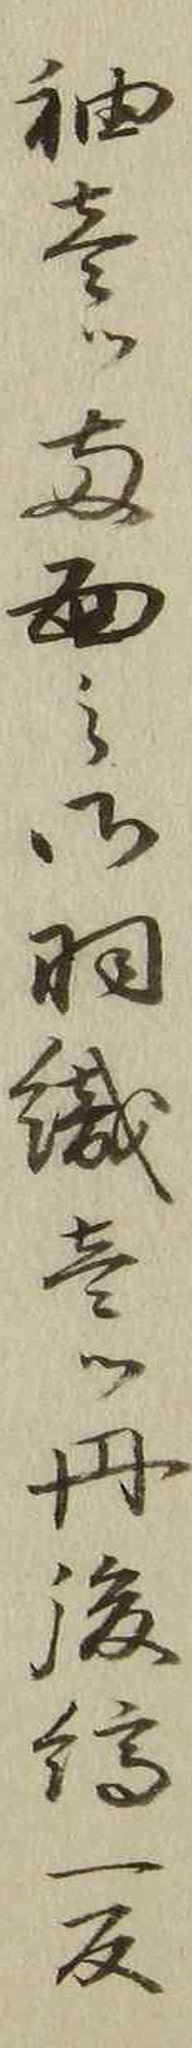袖壱つ両面之御羽織壱つ丹後縞一反
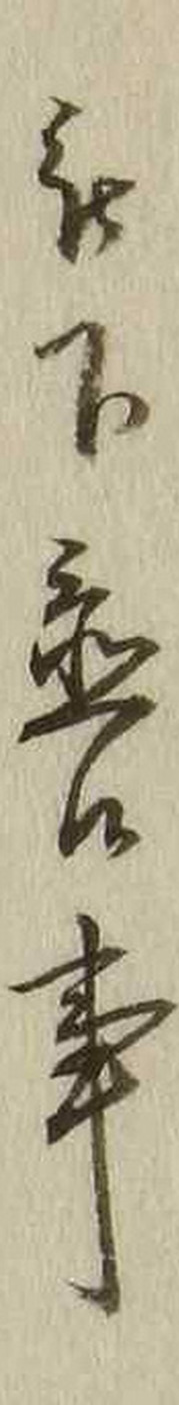被下置候事
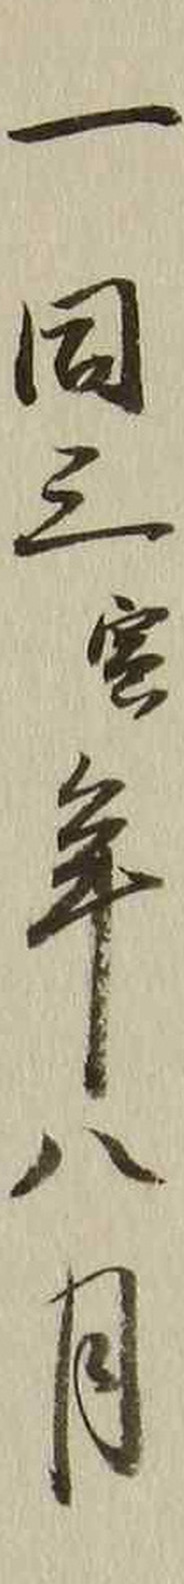一同三寅年八月
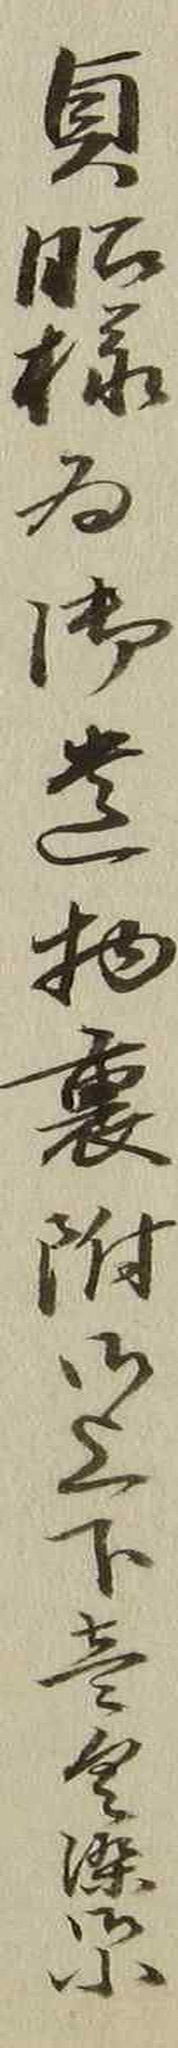貞昭様為御遺物裏附御上下壱具染御小
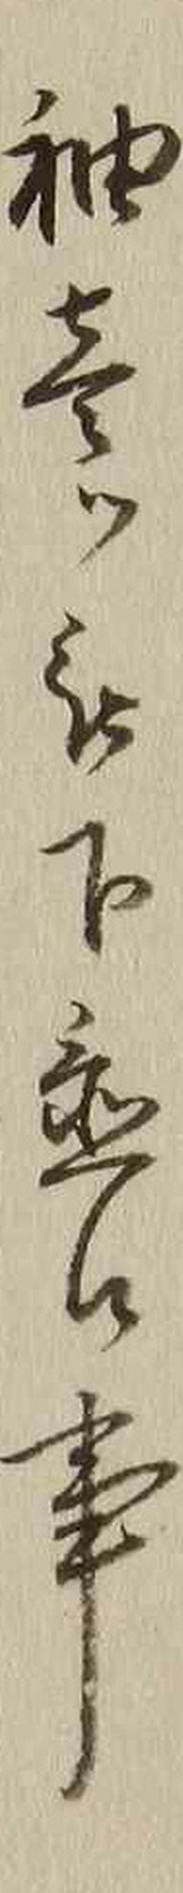袖壱つ被下置候事
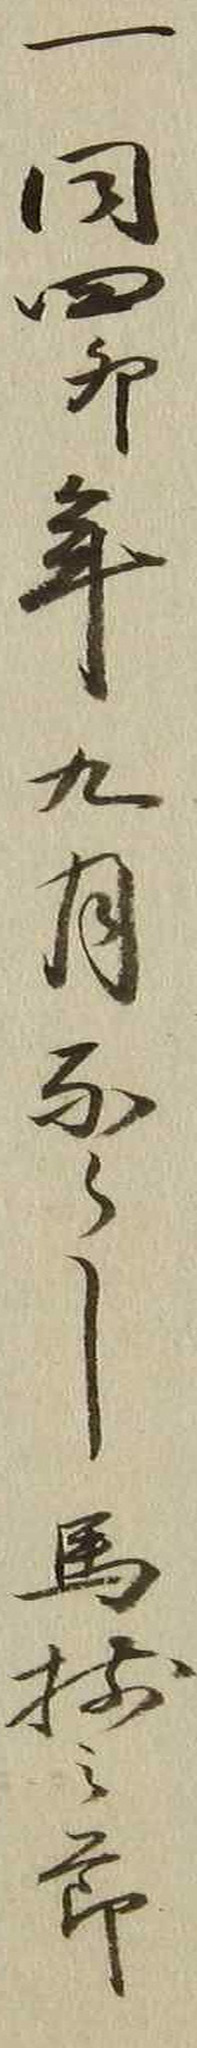一同四卯年九月ならし馬揃之節
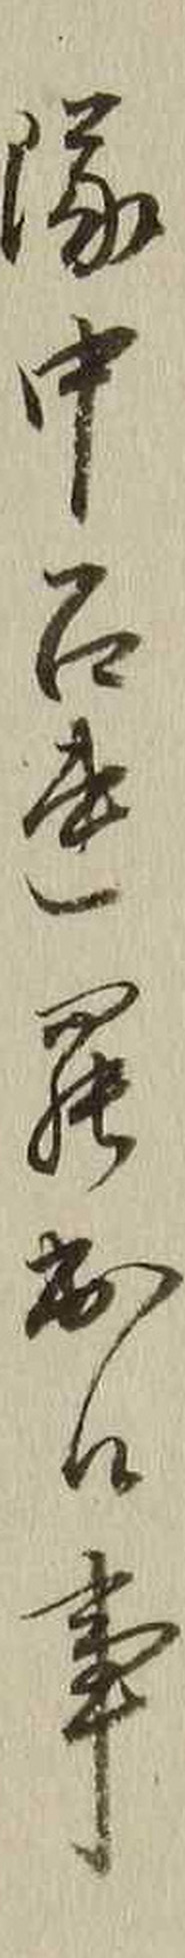隊中召連罷出候事
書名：諸士系譜　巻之133　た之部9
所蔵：会津若松市立会津図書館
